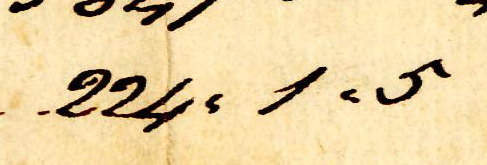224.1.5
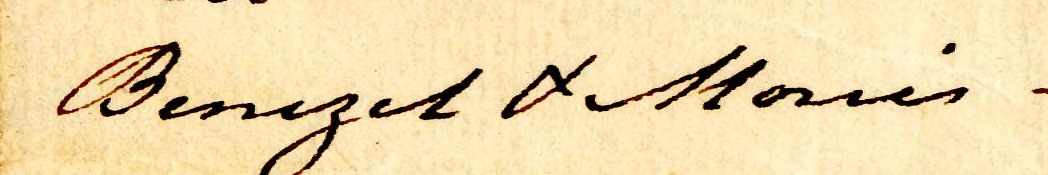Benezet & Morris
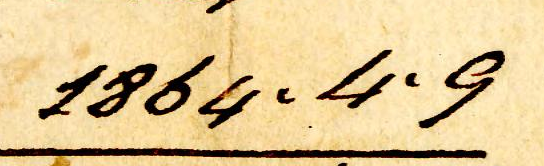1864.4.9
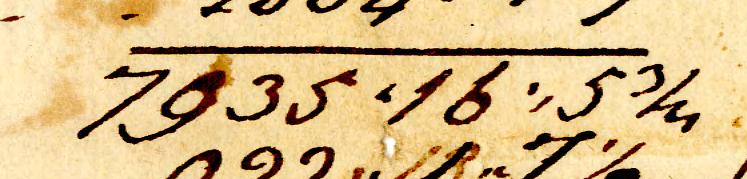7935.16.5 3/4
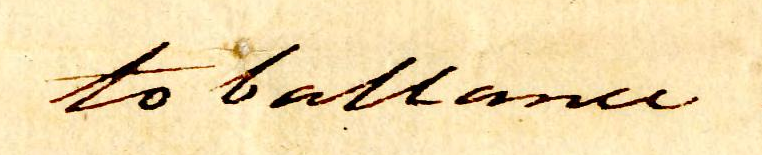to ballance
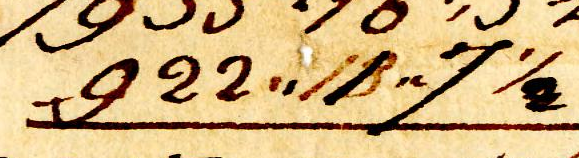922.1.7 1/2
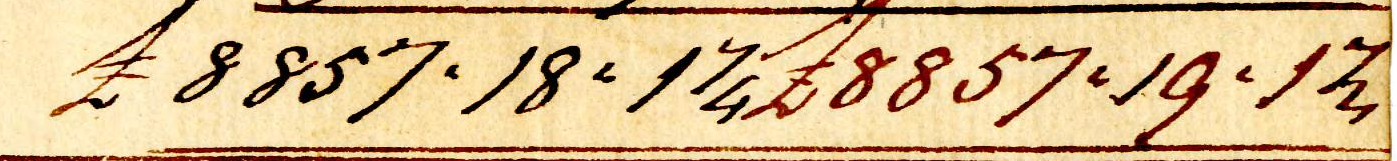£8857.18.1 1/4 £8857. 9.1 1/4
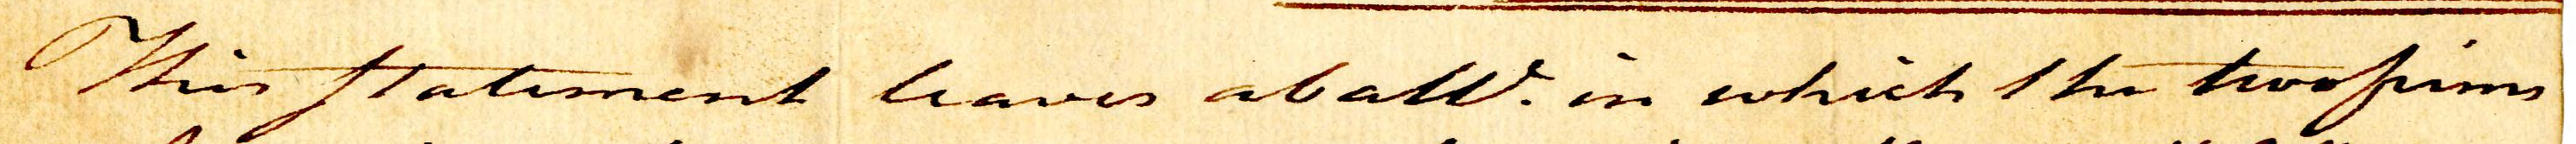This statement leaves a ball^e. in which the two firms
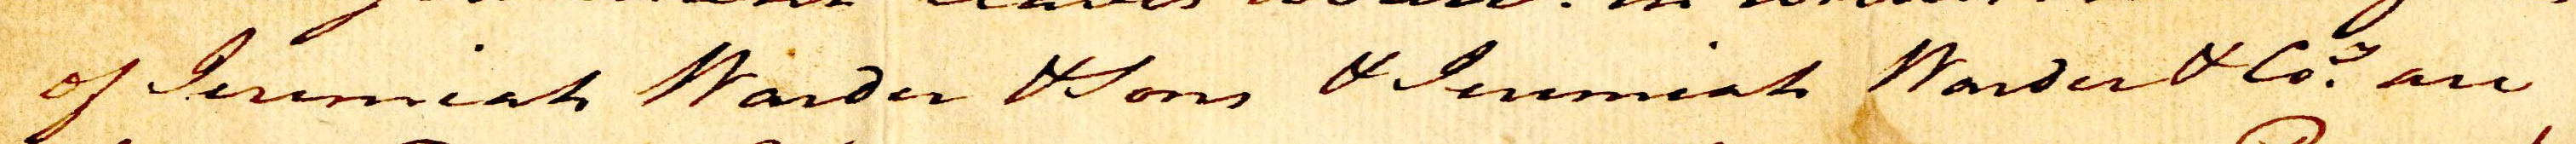of Jeremiah Warder & Sons & Jeremiah Warder & Co^y. are
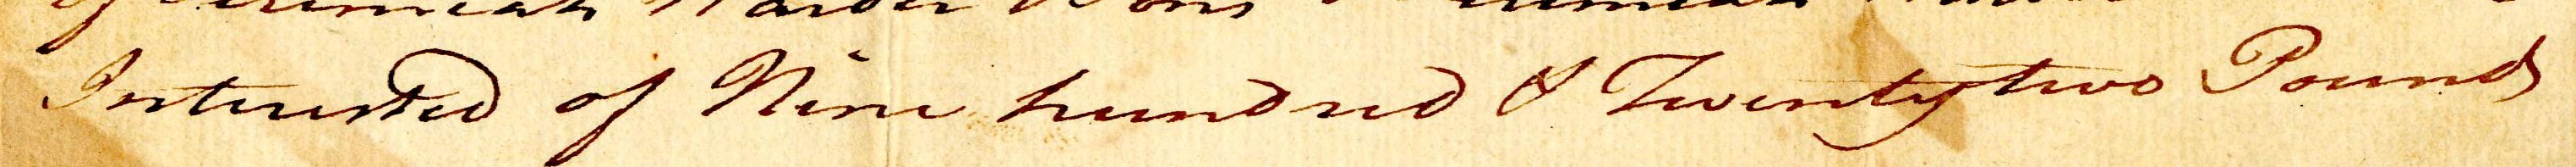Interested of Nine hundred & Twenty two Pounds
